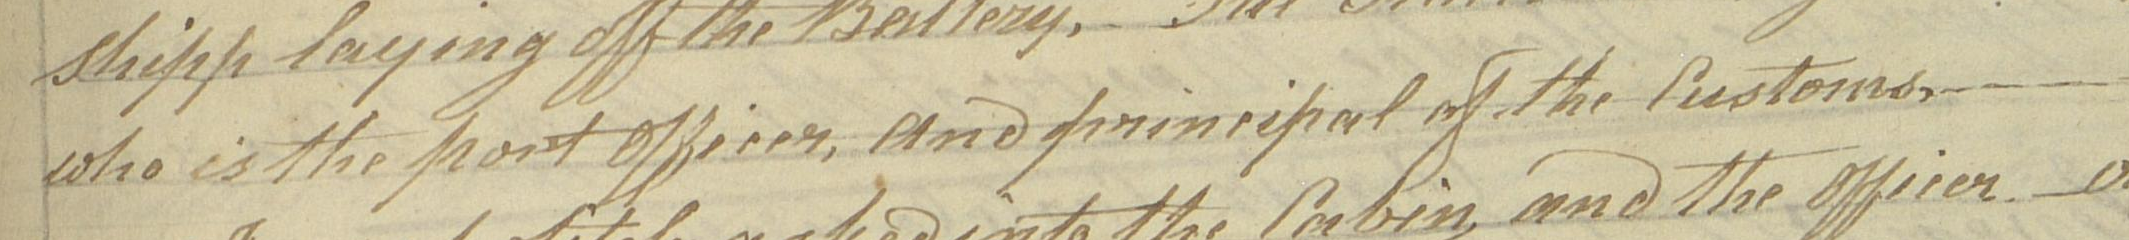who is the port Officer, and principal of the Customs,
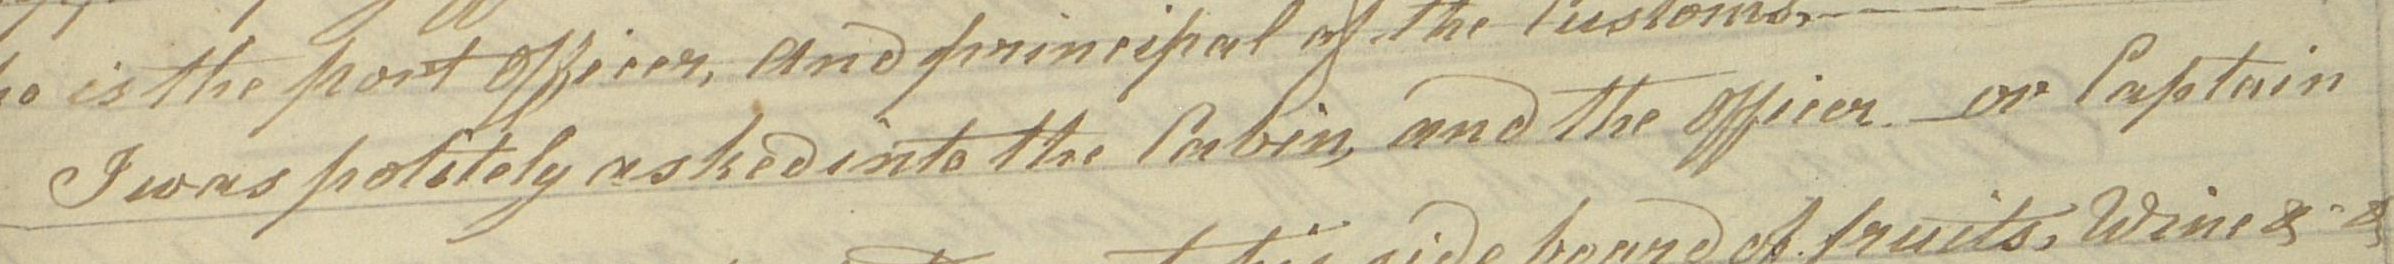I was politely asked into the Cabin, and the officer or Captain
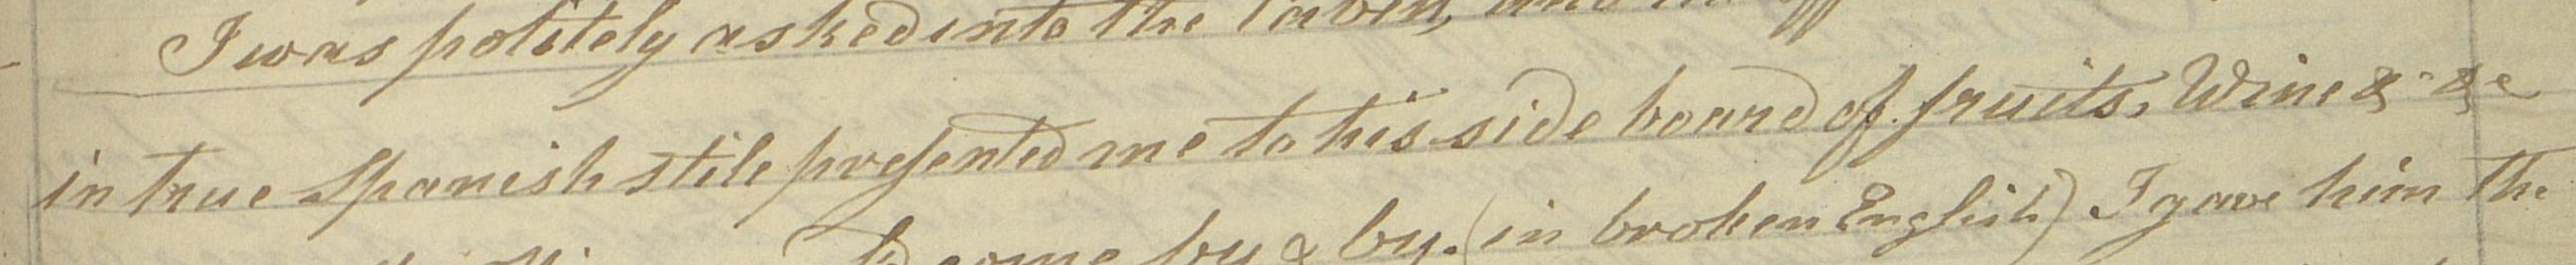in true Spanish still presented me to this side board of fruits, Wine &^c &^c
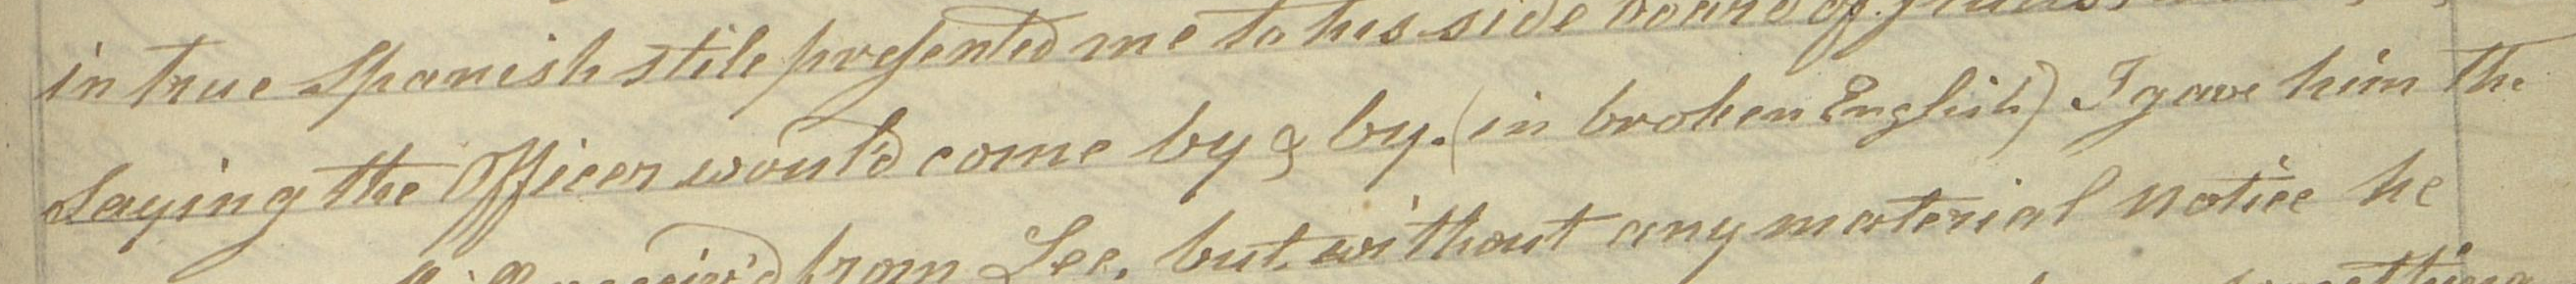Saying the Officer would come by & by in broken English) I gave him the
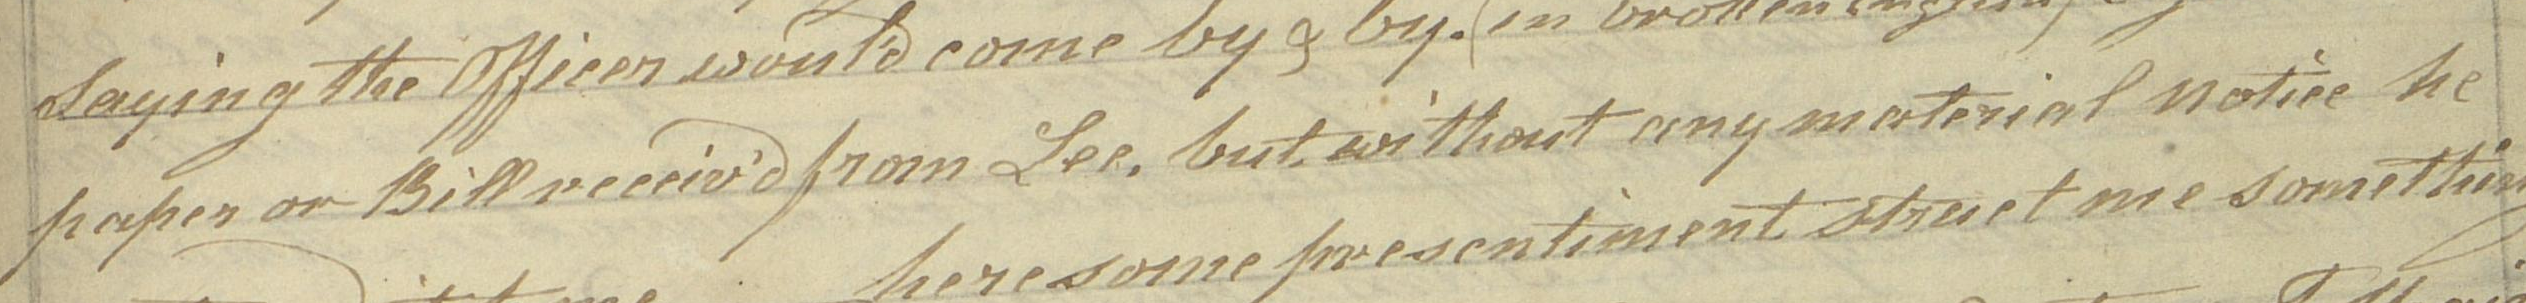paper, or Bill receiv'd from Lec. but without my material Notice he
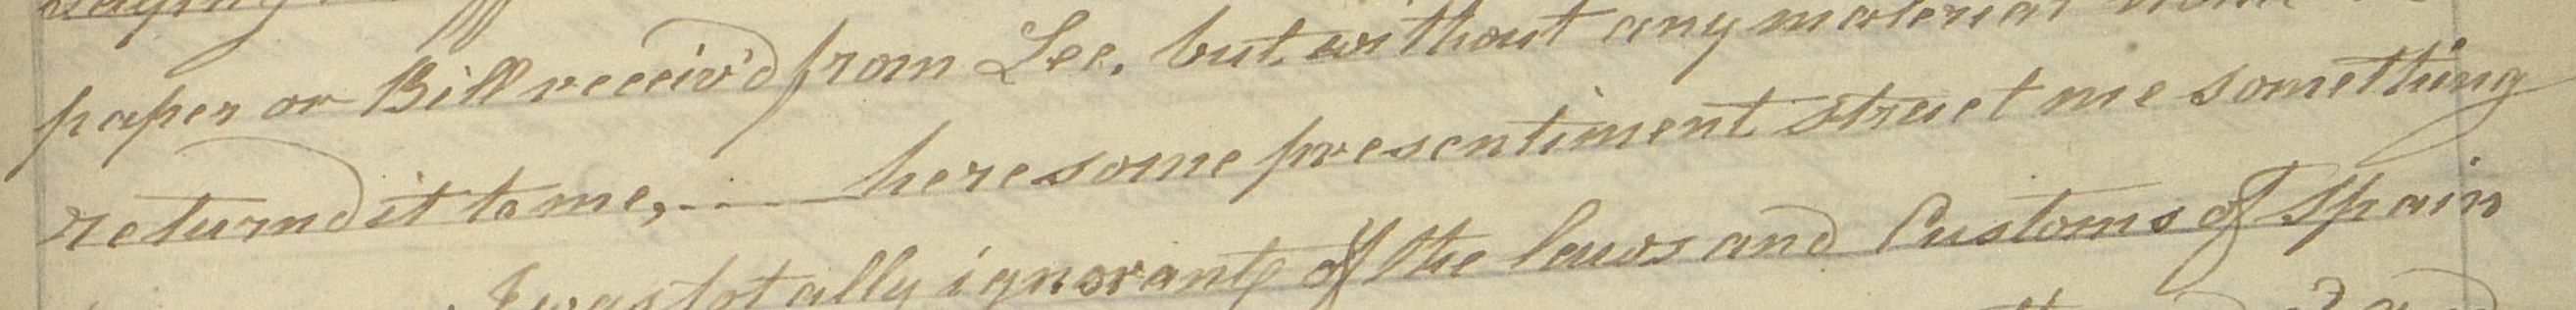returnd it to me, here some presentiment struct me something
